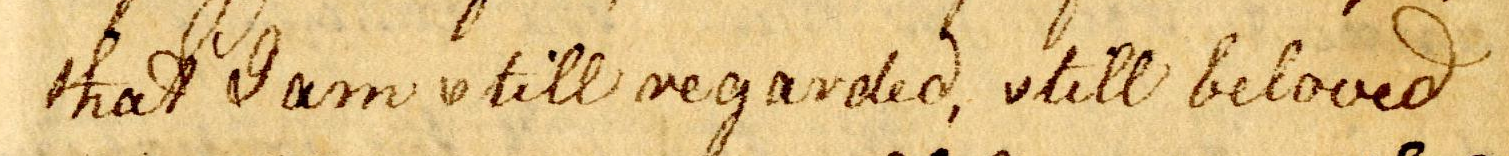that I am still regarded, still beloved
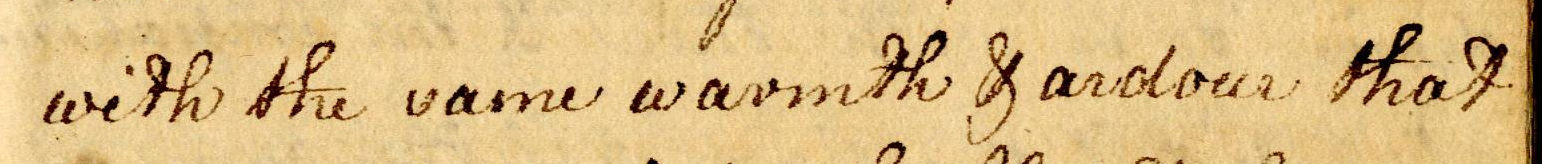with the same warmth & ardour that
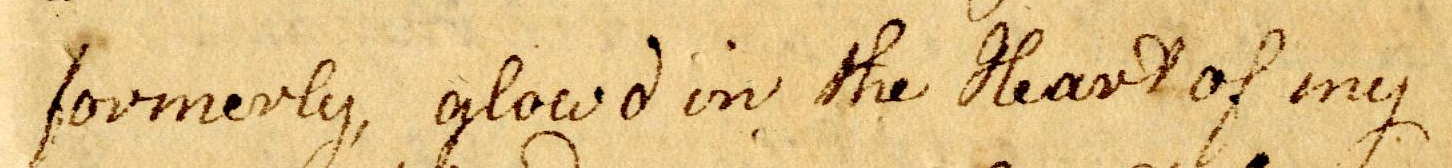formerly, glowd in the Heart of my
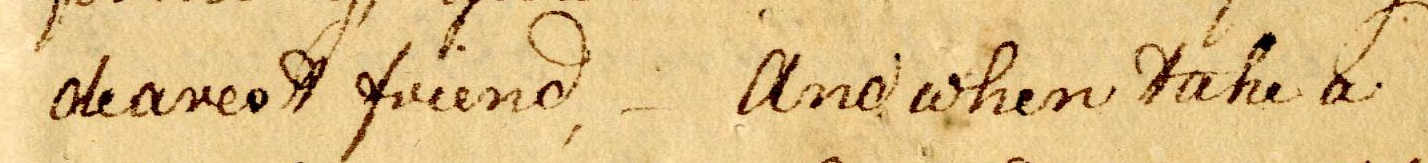dearest friend- And when take a
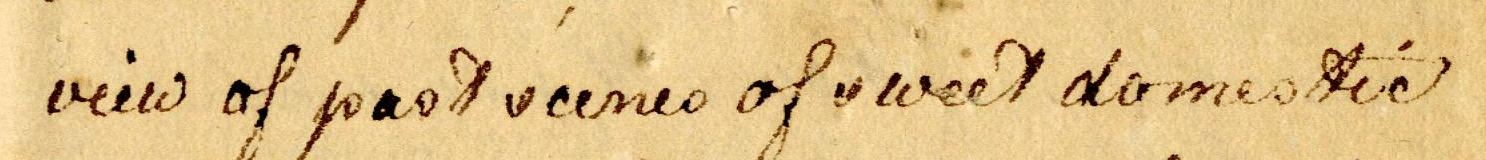view of past scenes of sweet domestic
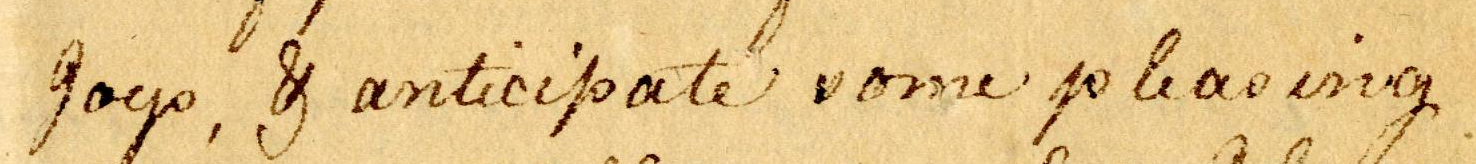Joys, & anticipate some pleasing
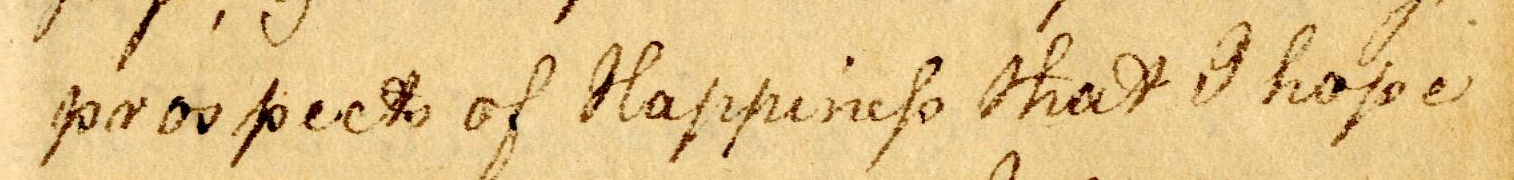prospects of Happiness that I hope
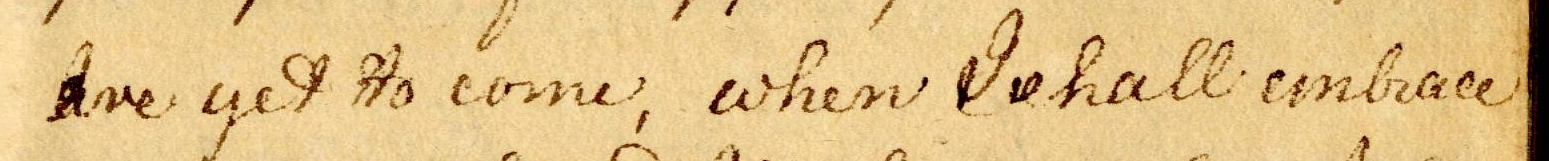are yet to come, when I shall embrace
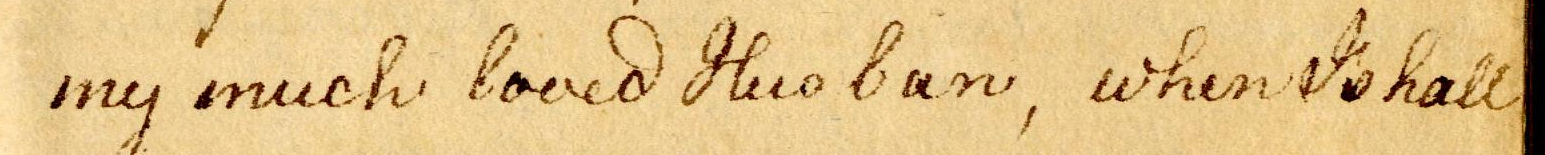my much loved Husban, when I shall
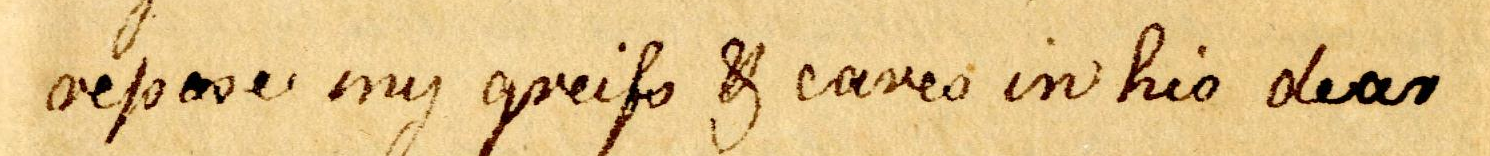repose my greifs & cares in his dear
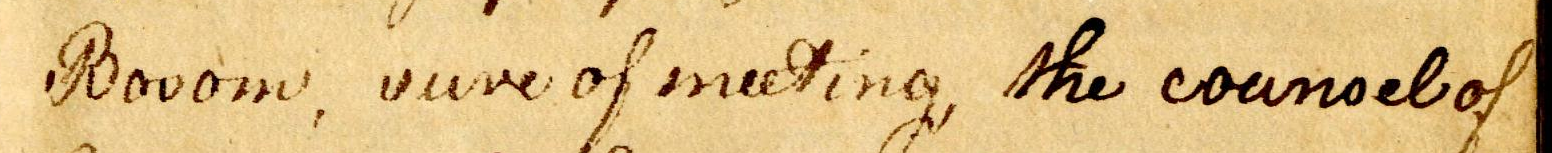Bosom, sure of meeting, the counsel of
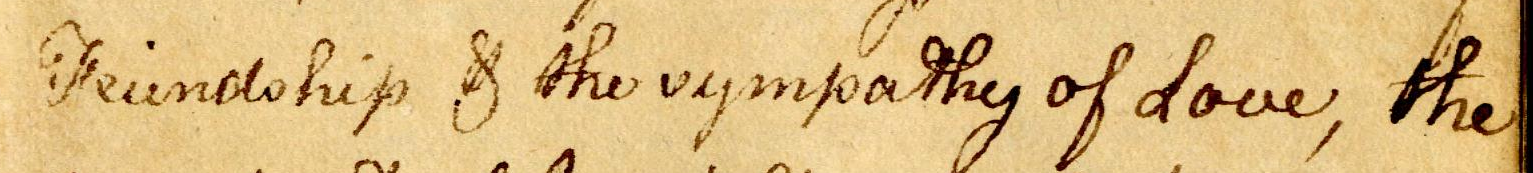Friendship & the sympathy of Love, the
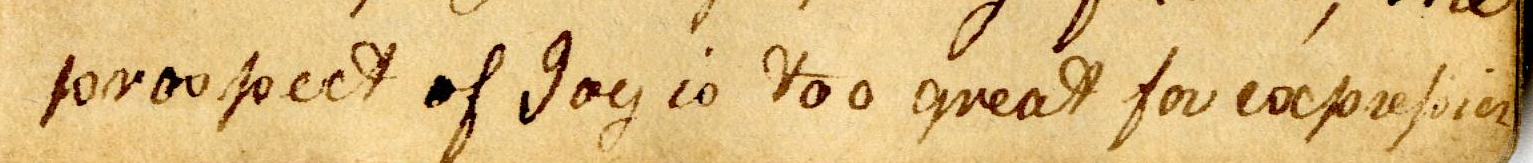prospect of Joy is too great for expression
